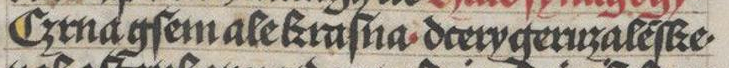Czrna gſem ale kraſna. dcery geruzalēſke.
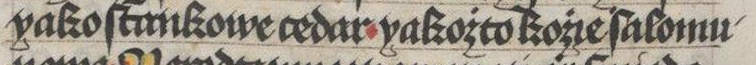yako ſtankowe cedar.yakożto kożie ẛalomu¬
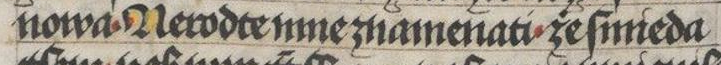nowa.Nerodte mne znamenati.że ſmieda
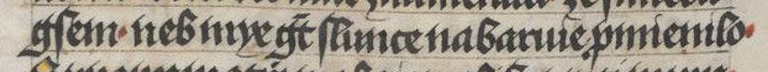gſem.neb mye ḡt ſlunce na baruie ꝑmienilo.
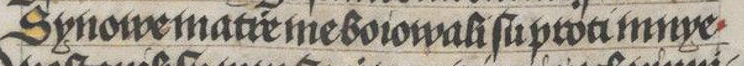Synowe matṙe me boiowali ſu proti mnye
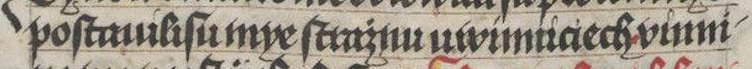postauiliſu mye ſtrażnu u winniciech vinni¬
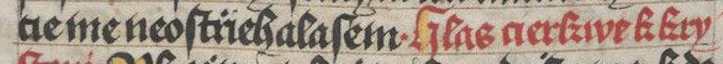cie me neoſtṙiehala ſem.Hlas cierkwe k kry¬
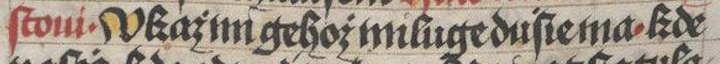ſtoui.Vkażmi gehoż miluge duẛie ma.kde
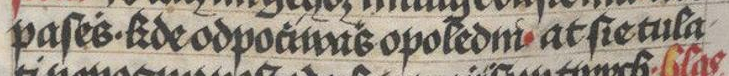paſeṡ.kdeodpoċíwaṡ o poledni.at ſie tula¬
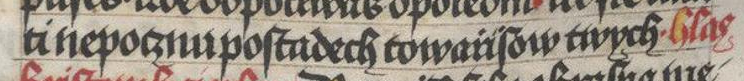ti nepocznu poſtadech towaṙiẛow twych.hlas
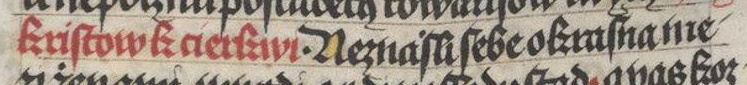kriſtow k cierkwi.Neznaẛli ſebe okraſna me¬
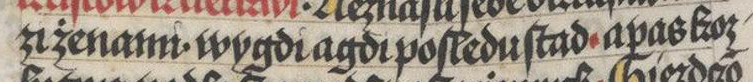zi żenami. wygdi a gdi poſledu ſtad.a pas koz¬
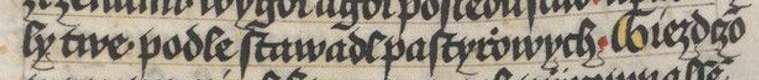ly twe podle ſtawadl paſtyṙowych.Giezdczō
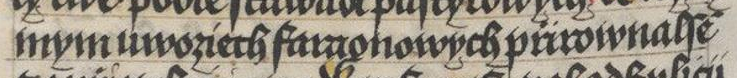mym u woziech faraonowych pṙirownal ſē
